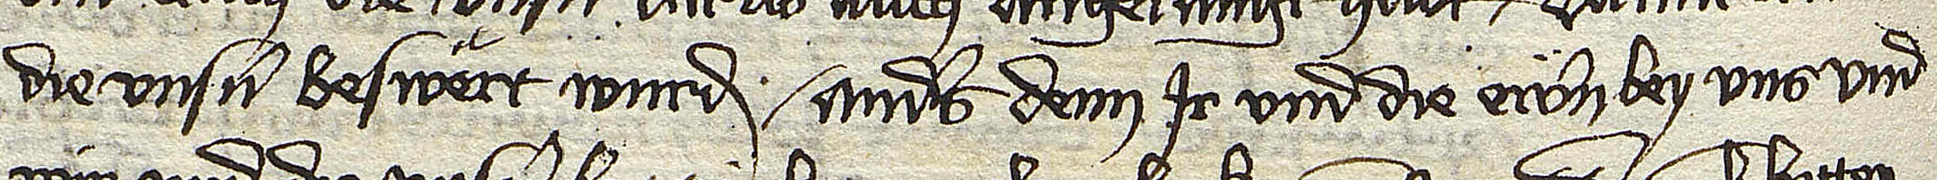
die vnſ*n beſwërt wurd* / and*s denn Ir vnd die eẅ*n bey vns vnd
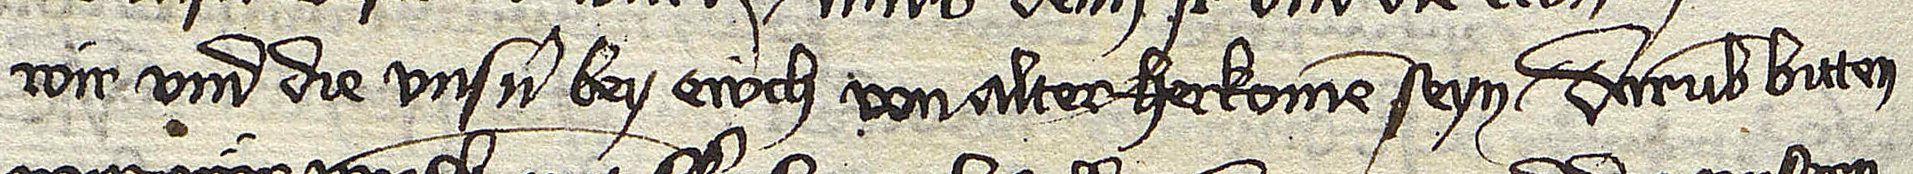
wir vnd die vnſ*n bey eẅch von alter herkome* ſeyn / Darub* bitten
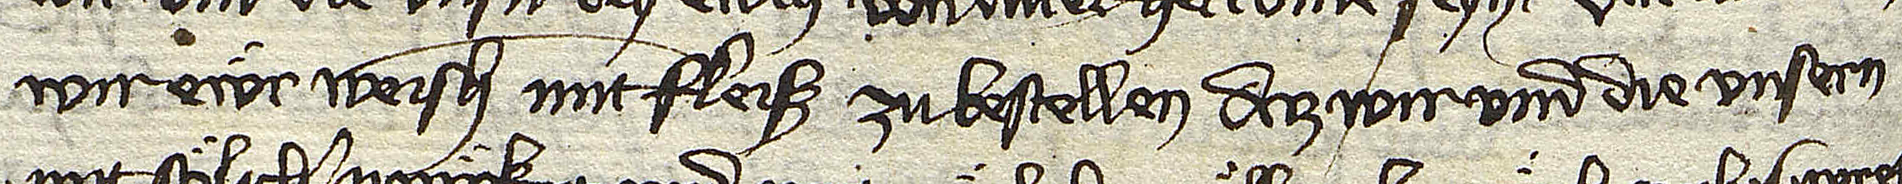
wir eẅr weiſh* mit fleiſʒ ʒu beſtellen daʒ wir vnd die vnſern
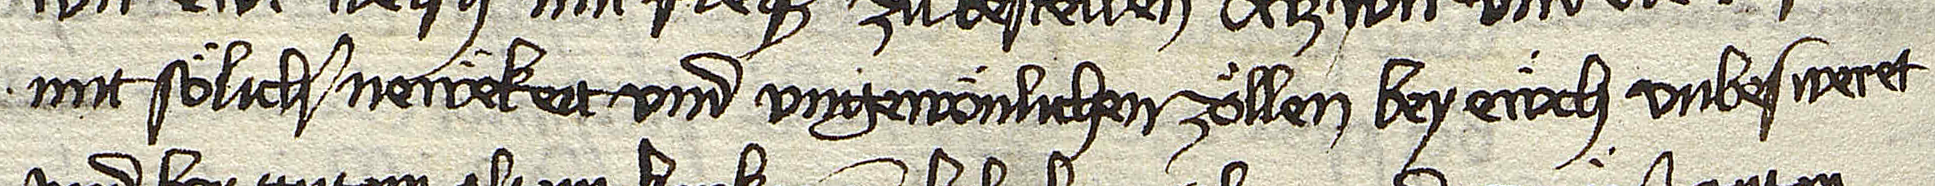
mit ſölich* neẅekeit vnd vngewönlichen ʒöllen bey eẅch vnbeſweret
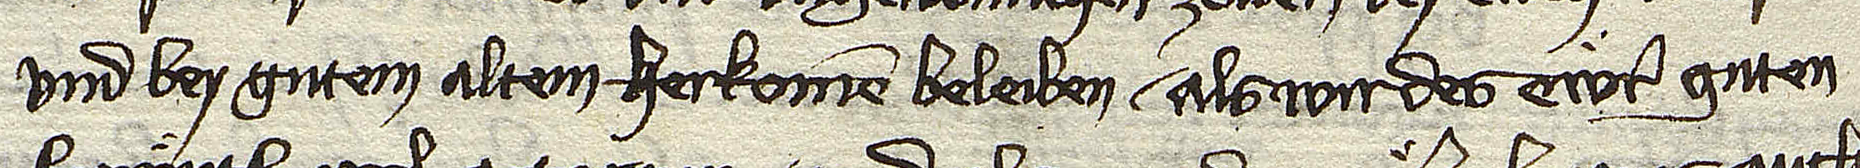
vnd bey gutem altem herkome* beleiben /als wir des eẅr guten
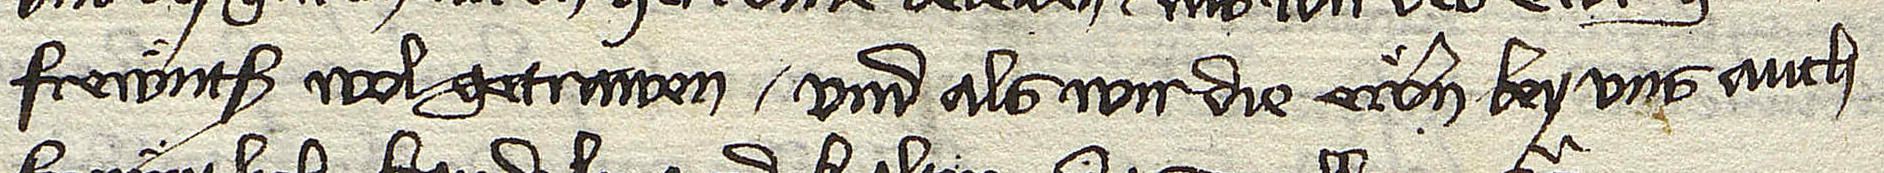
freẅntſ* wol getrawen / vnd als wir die eẅ*n bey vns auch
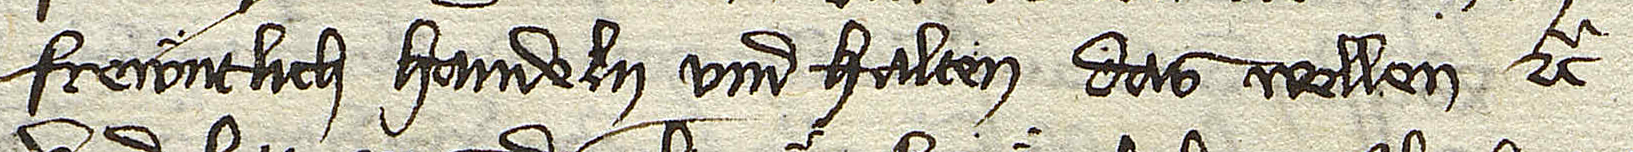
freẅntlich handeln vnd halten das wellen ec*
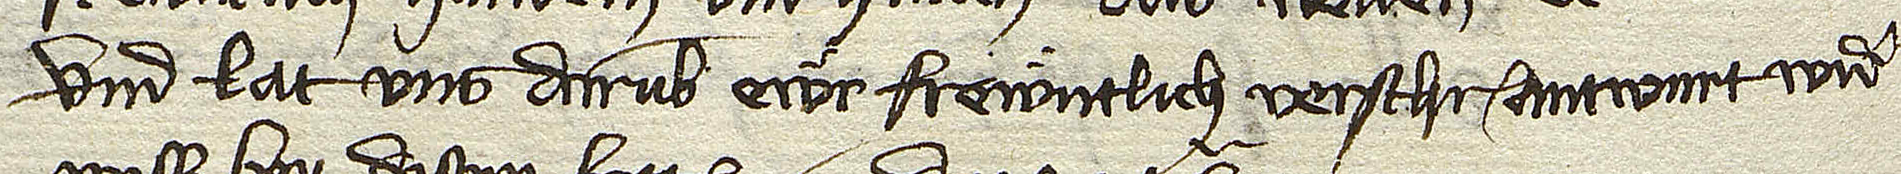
Vnd lat vns darub* eẅr freẅntlich verſchr* antwurt wid*
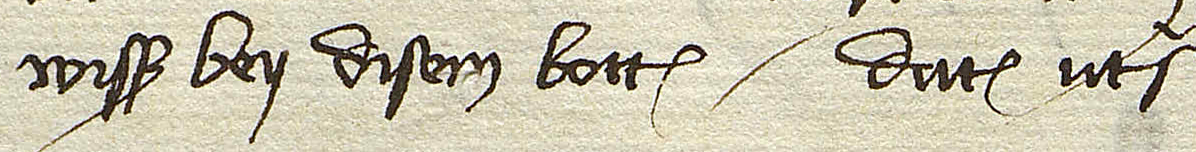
wiſſ* bey diſem bott* / dat* ut ſ*
